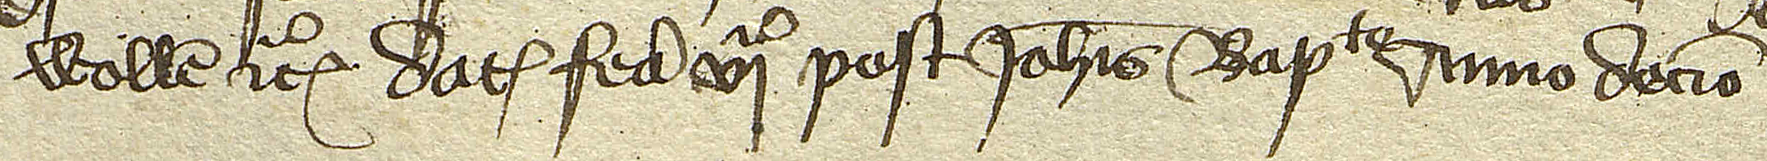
wölle* ec* dat* fea* vi* poſt Iohis* Bap* Anno decio*
